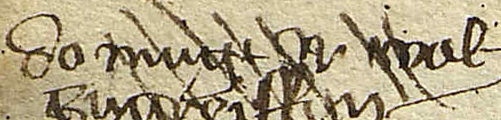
do mugt Ir wol
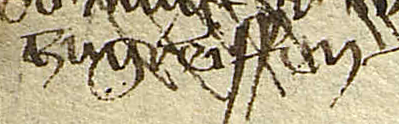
cʒugreiffen
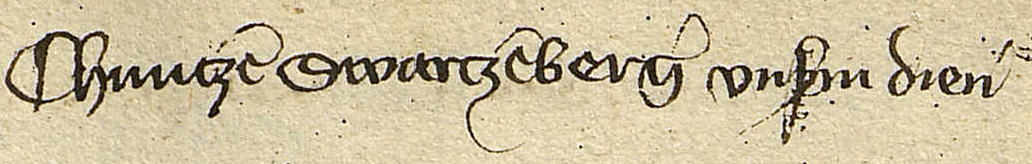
Chuncʒe* Swarʒe*berg* vnſ*m dien*
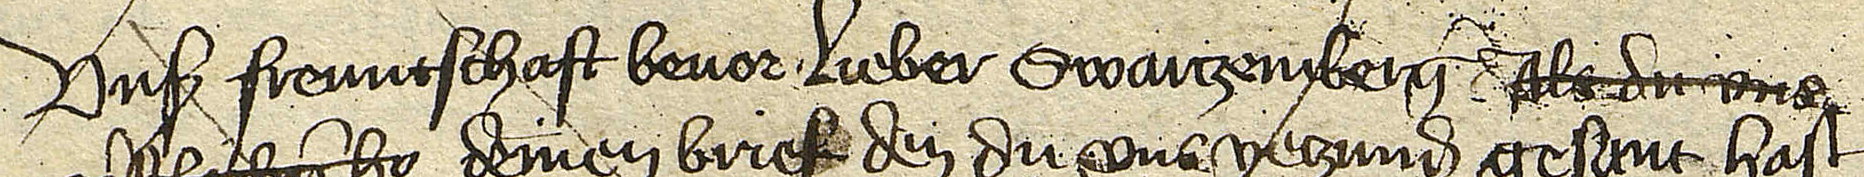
Vnſ* freuntſchaft beuor / Lieber Swarcʒemberg* / Als du vns
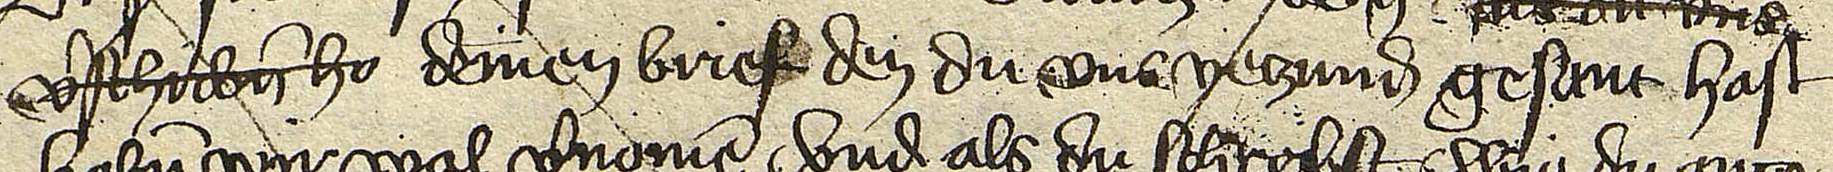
v*ſchribn* h deinen brief den du vns yecʒund* geſant haſt
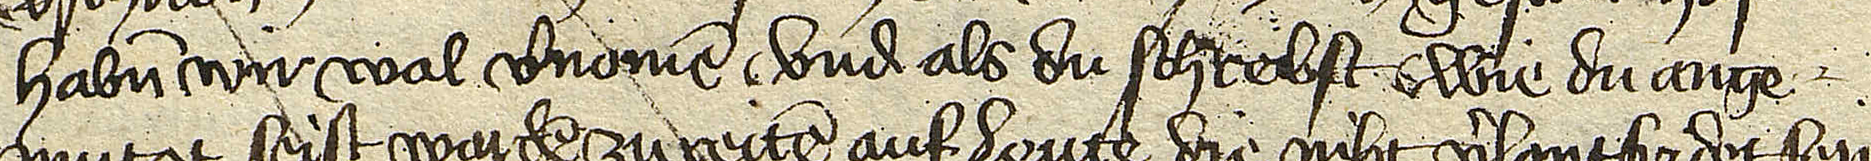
habn* wir wol v*nome* / vnd als du ſchreibſt / wie du ange =
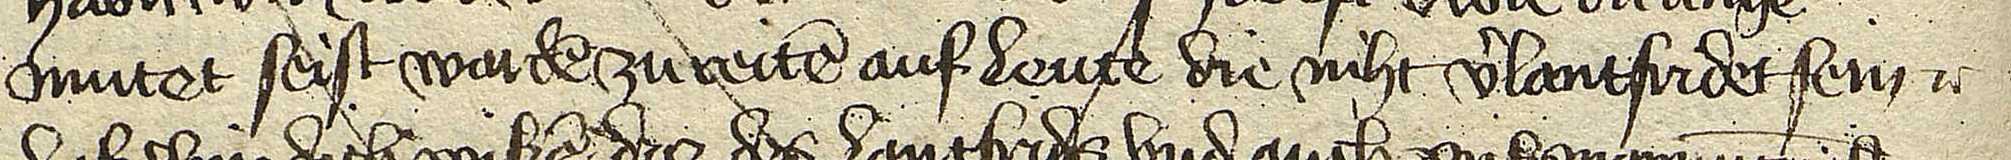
mutet ſeiſt worde* cʒu reite* auf leute die niht v*lantfridet ſein ec*
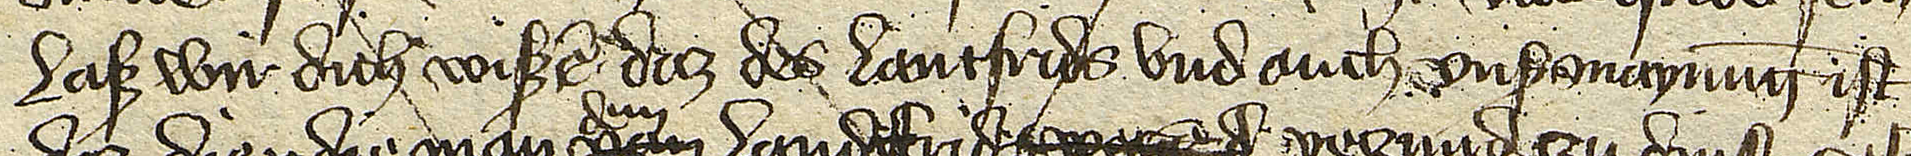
laſʒ wir dich wiſʒe* / daʒ des lantfrids vnd auch vnſ* maynug* iſt
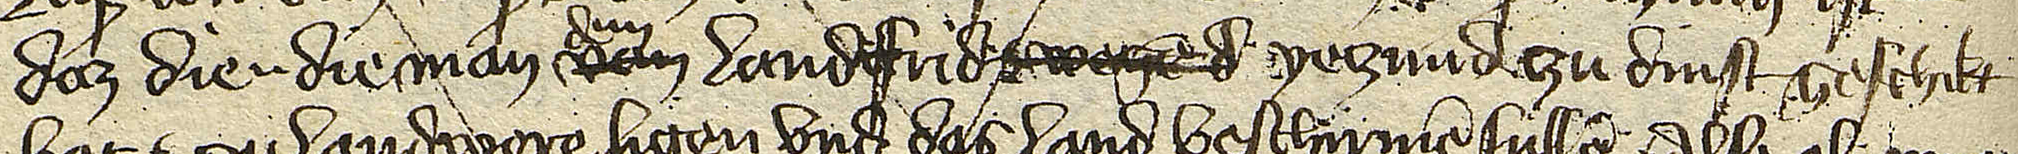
daʒ die ~ die man von landfrids wege* d yecʒund cʒu dinſt geſchikt
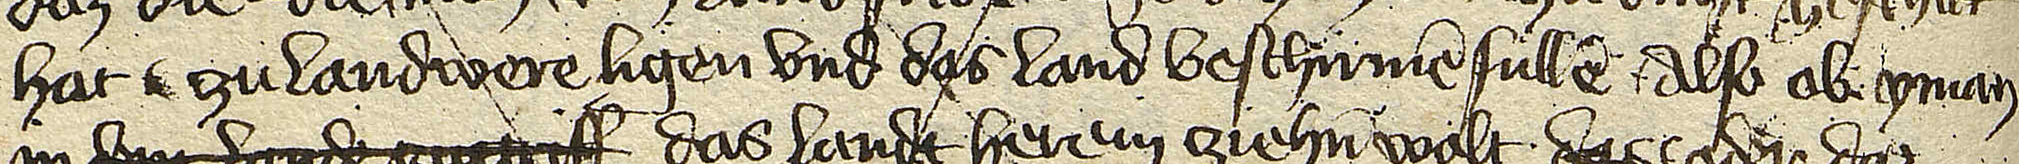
hat / cʒu landwere ligen vnd das land beſchirme* ſülle* / Alſo ob yman
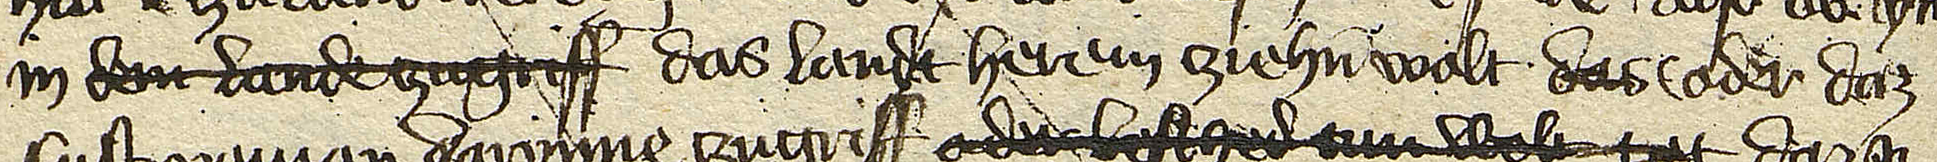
in dem lande cʒugriff das landt herein cʒiehn* wolt das / oder daʒ
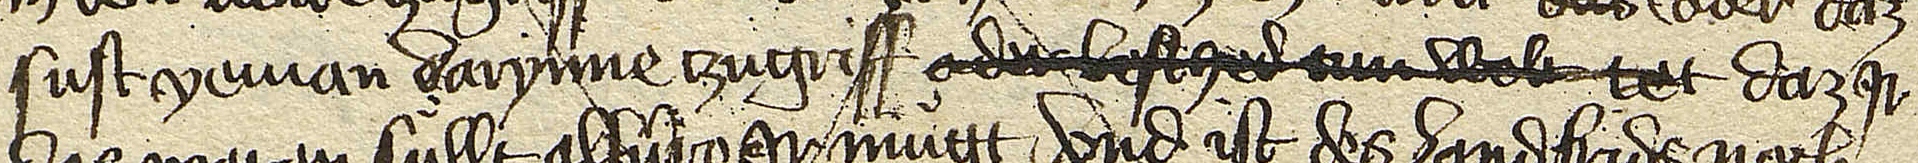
ſuſt yeman darynne cʒugriff oder beſched tun welt tet daʒ Ir
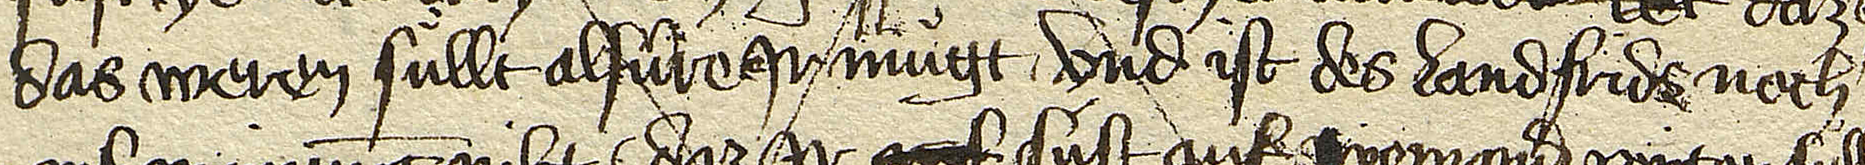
das weren ſüllt alſu*re Ir mügt / vnd iſt des landfrids noch
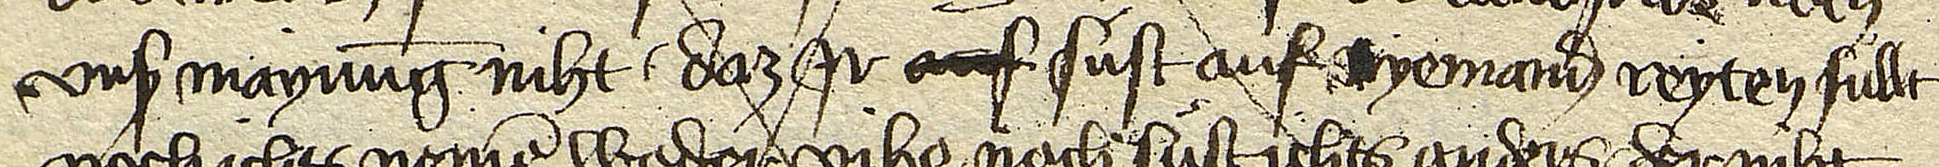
vnſ* maynug* niht / daʒ Ir auf ſüſt auf nyemand* reyten ſüllt
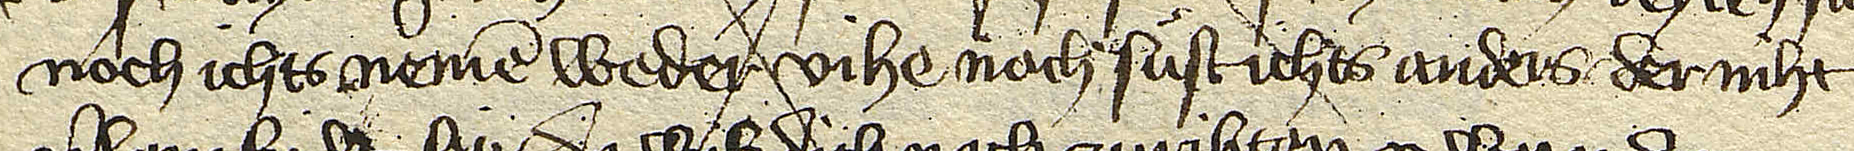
noch ichts neme* weder vihe noch ſüſt ichts anders / der niht
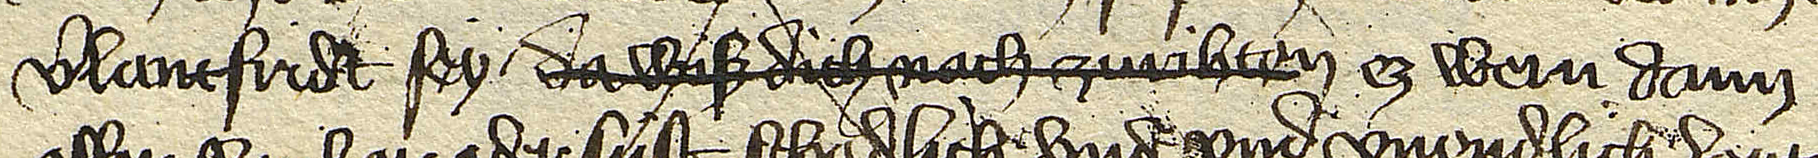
v*lantfridt ſey / da wiſʒ dich nach cʒurihten eʒ wern dann
